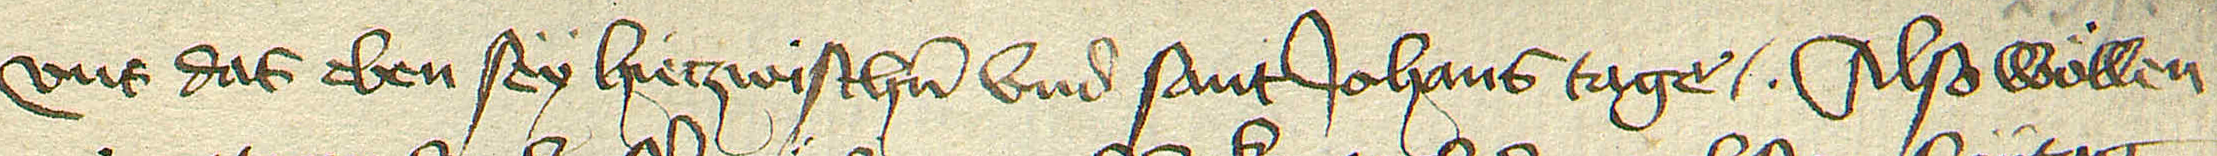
vns das eben ſey hiecʒwiſchn* vnd ſant Iohans tage / . Alſo wöllen
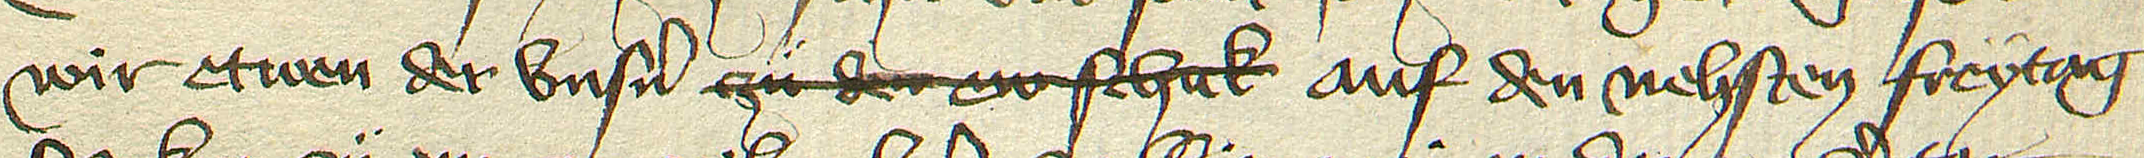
wir etwen der vnſn* cʒü den ew ſchick auf den nehſten freytag
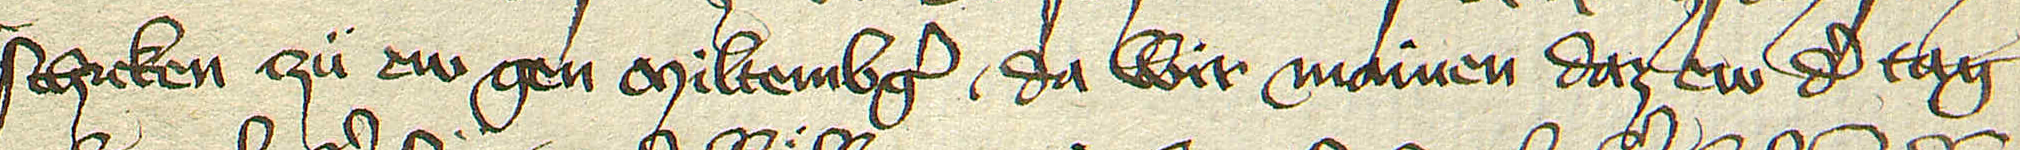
ſchicken cʒü ew gen Miltemb*g / da wir mainen daʒ ew d* tag
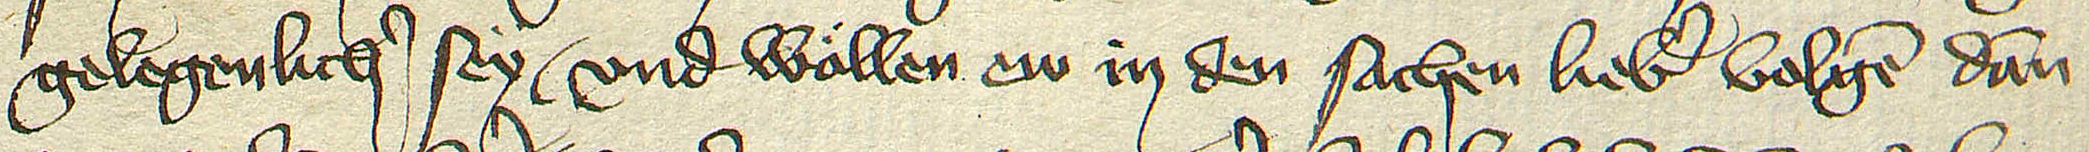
gelegenlich* ſey / vnd wöllen ew in den ſachen lieb* volge* dan*
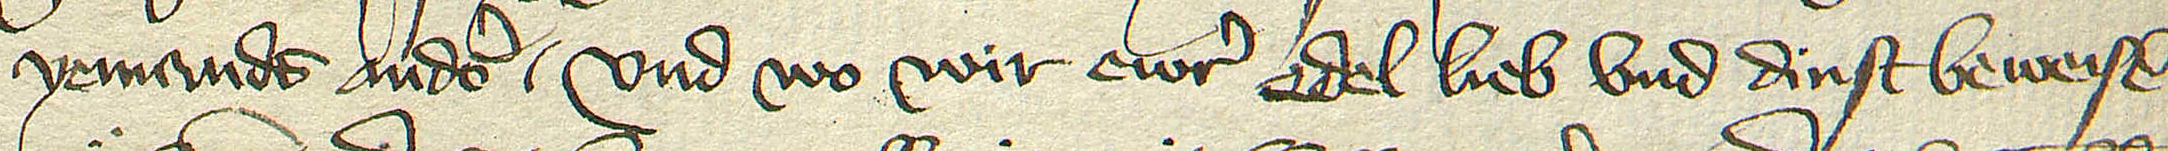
yemands ands* / vnd wo wir ewr* edel lieb vnd dinſt beweiſe*
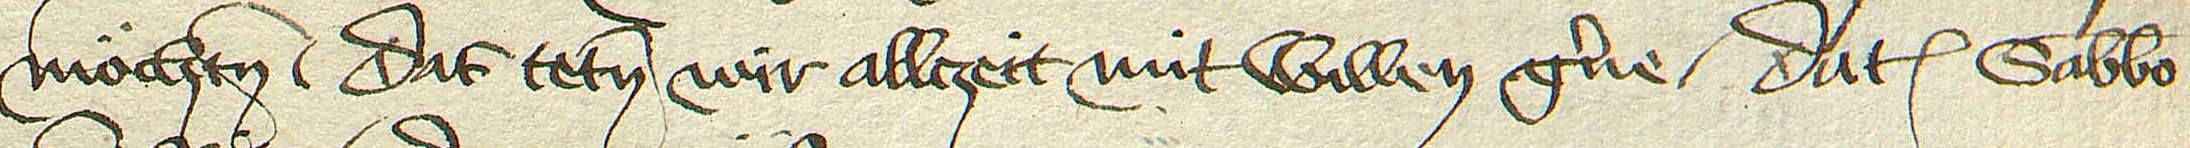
möchtn* / Das tetn* wir allcʒeit mit willen g*ne / Dat* Sabbo*
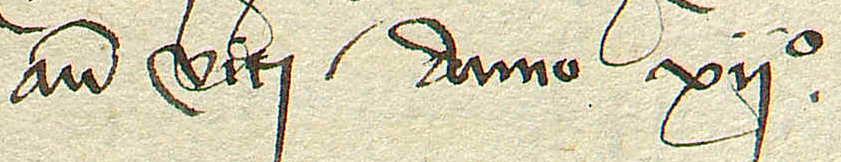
an* viti / Anno xii* .
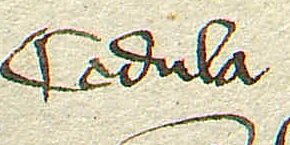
Cedula
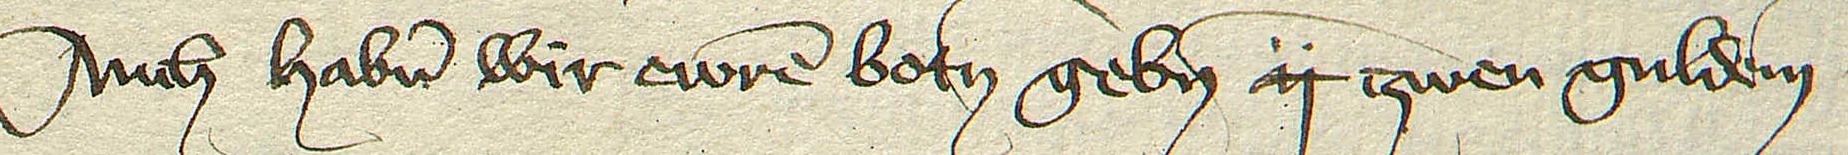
Auch habn* wir ewre* botn* gebn* ii cʒwen guldein* /
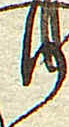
H*
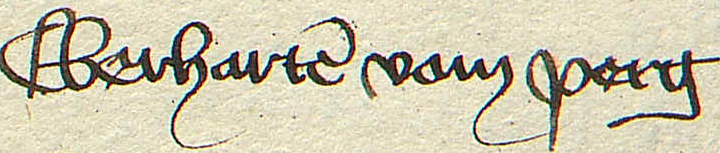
Eberharte* vom Perg
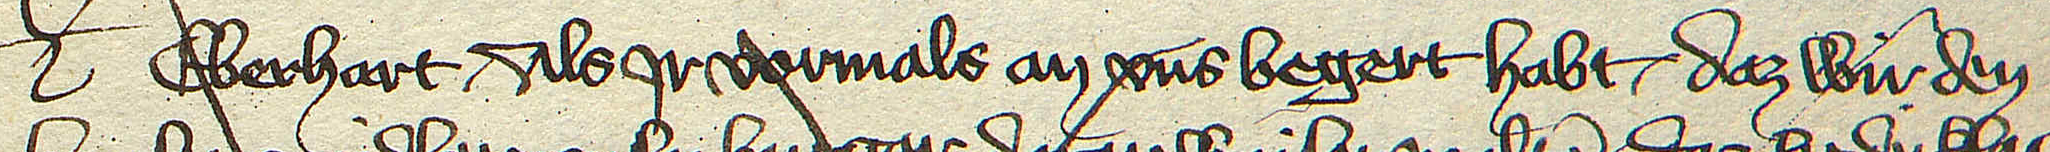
L* Eberhart / Als Ir vormals an vns begert habt / daʒ wir den
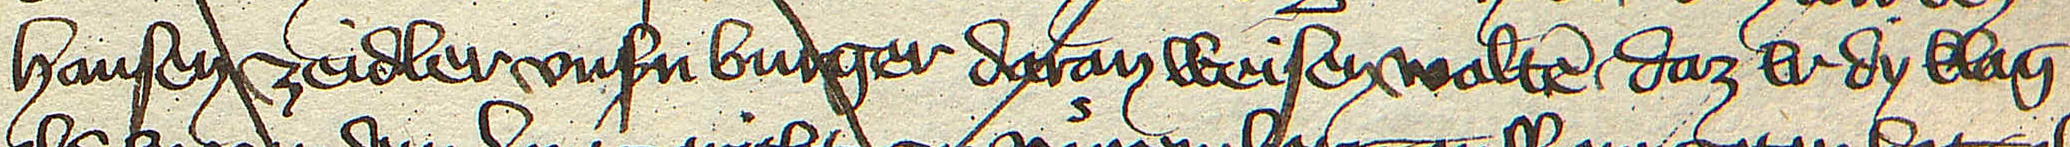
Hanſen cʒeidler vnſ*n burger daran weiſen wolte* / daʒ Er dy klag
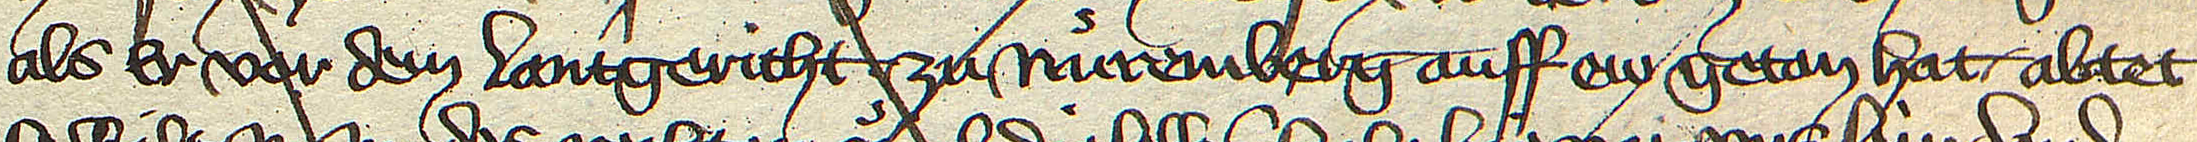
als Er vor dem Lantgericht cʒu Nüremberg auff ew getan hat / abtet
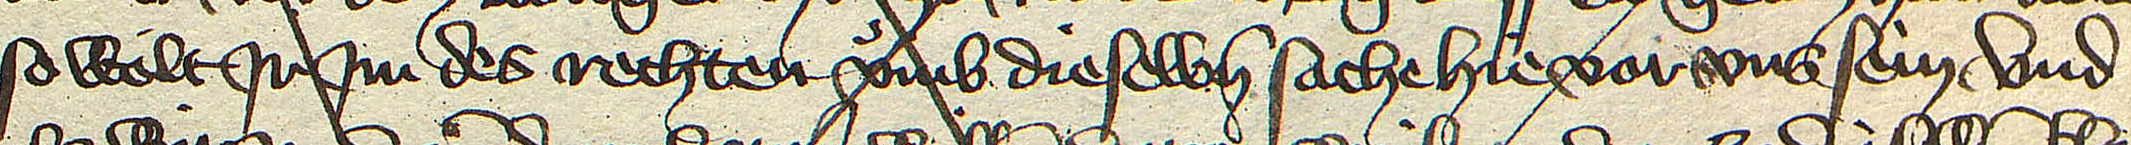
ſo wolt Ir Im des rechten v̈mb dieſelbn* ſache hie vor vns ſein / vnd
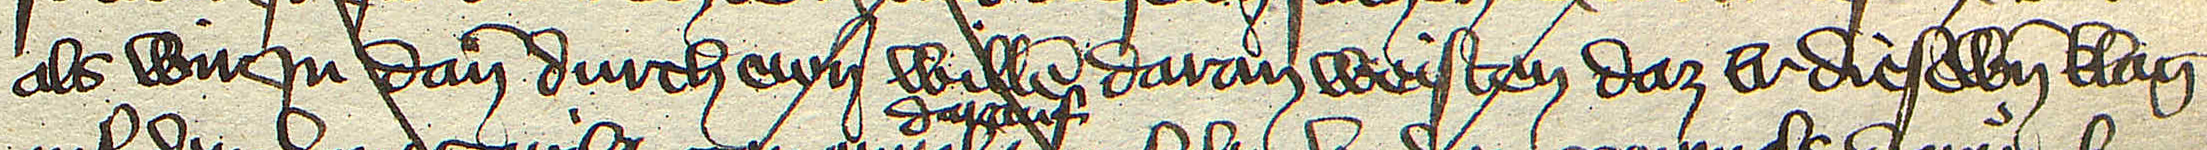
als wir In dan* durch ewn* wille* daran weiſten daʒ Er dieſelbn* klag
